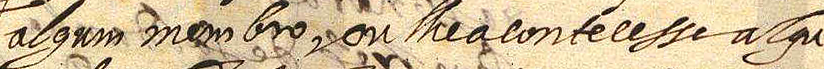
algum membro ou lhe acontecesse algū
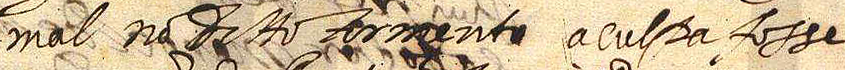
mal no ditto tormento a culpa fosse
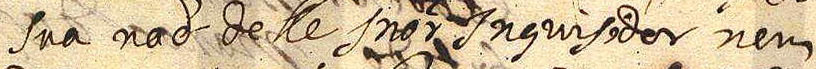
sua naõ delle snōr Inquisidor nem
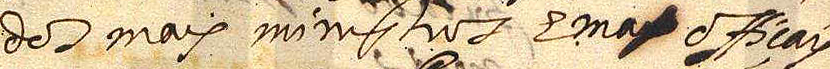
dos mais ministros E ma_ offiçais
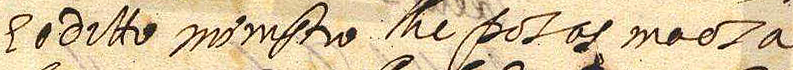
E o ditto ministro lhe pos as maõs a
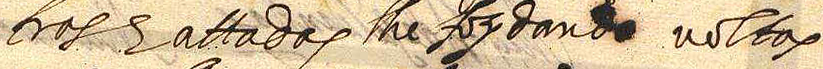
tras E attadas lhe foy dando uoltas
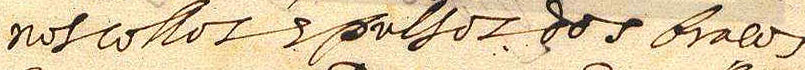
nos collos E pulsos dos braços
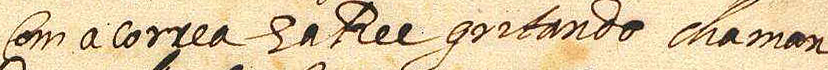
com a correa E a Ree gritando chaman
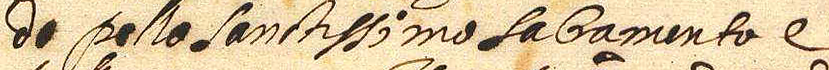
do pello sanctissimo sacramento e
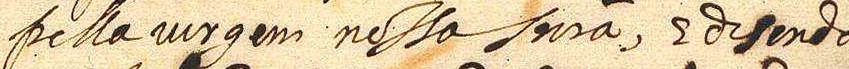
pella uirgem nossa snrā, E disendo
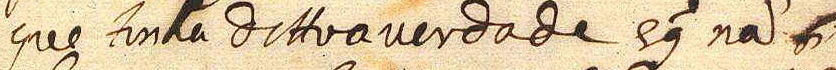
que tinha ditto a uerdade E q̄ nā ti
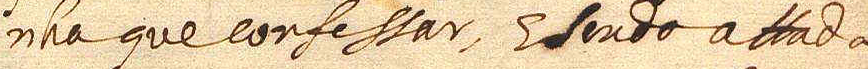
nha que confessar, E sendo attada
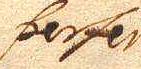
perfei
